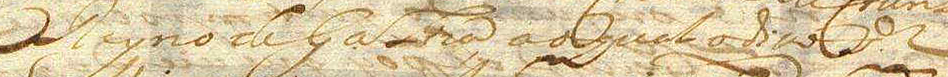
Reyno de GaLicia ao qual o ditto S.or
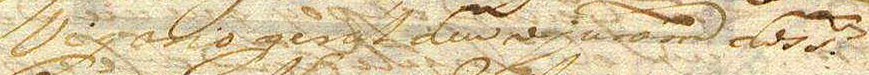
Vigario geral deu o juramto dos s.tos
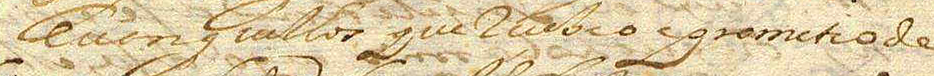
euanguelhos que Recebeo e prometeo de
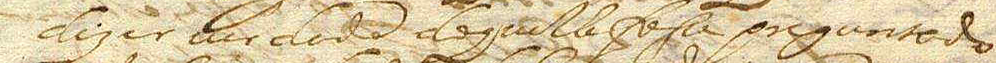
dizer uerdade do que lhe fosse preguntado
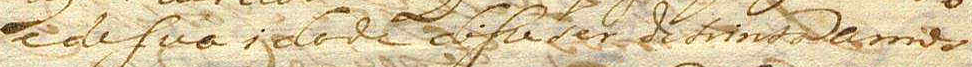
e de sua idade disse ser de trinta annos
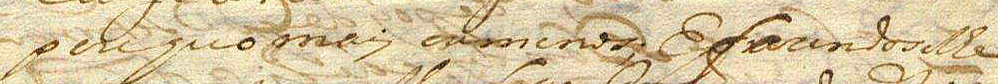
pouquo mais ou menos, E fazendoselhe
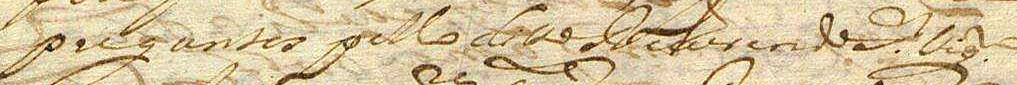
preguntas pello ditto Reuerendo s.or Vig.ro
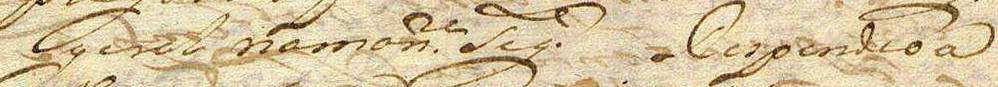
geral na man.ra seg.te Respondeo a
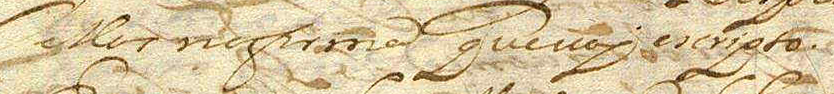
elles na forma que uaj escripto.
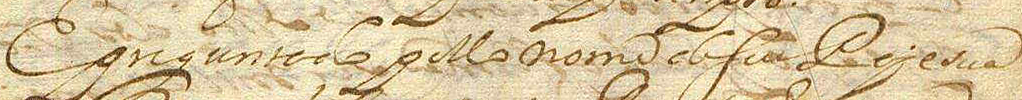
E preguntado pello nome de seu Paj e sua
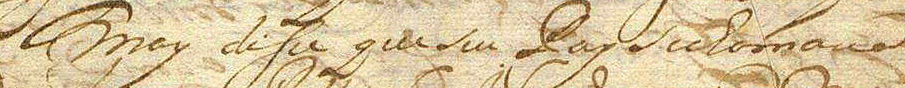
may disse que seu Pay se chamaua
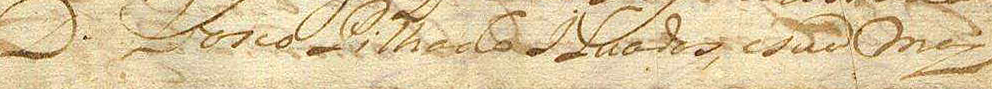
D. Vasco Pilhado Iluades, e sua may
